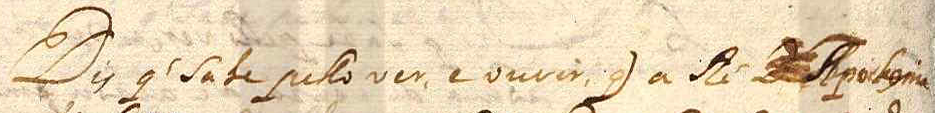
Dis q̄ sabe pello ver, e ouvir, q̄ a Ré _ Apolonia
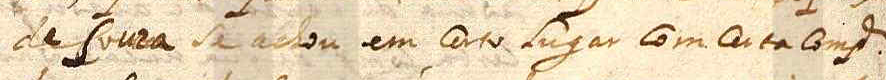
de souza se achou em certo Lugar com certa comp.a
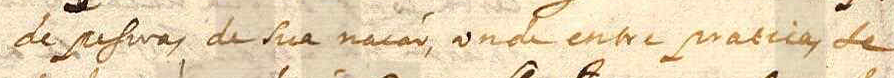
de pessoas de sua naçaõ, onde entre praticas se
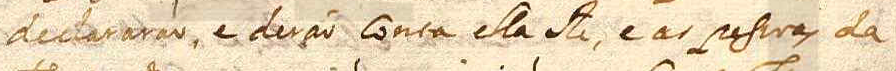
declararaõ, e deraõ conta ella Ré, e as pessoas da
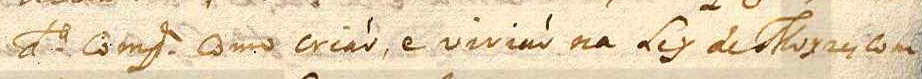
d̄a. comp.a como criaõ, e viviaõ na Ley de Moyzes com
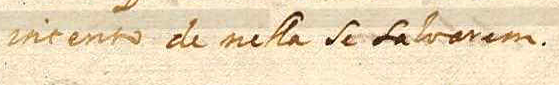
intento de nella se salvarem.
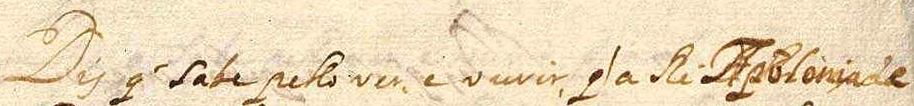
Dis q̄ sabe pello ver, e ouvir, q̄ a Re Apolonia de
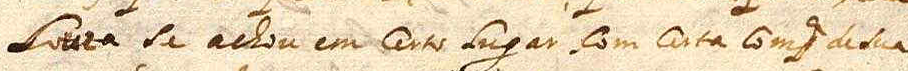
Souza se achou em certo Lugar, com certa compa de sua
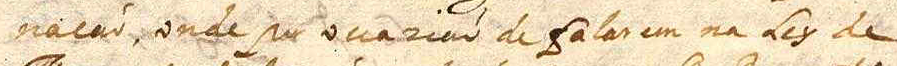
naçaõ, onde por occaziaõ de falarem na Ley de
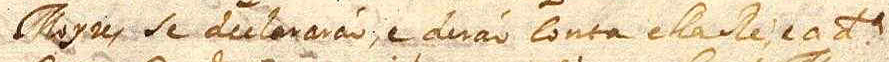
Moyzes se declararaõ, e derão conta ella Re e a d̄.a
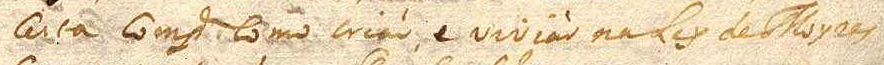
certa compa como criaõ, e viviaõ na Ley de Moyzes
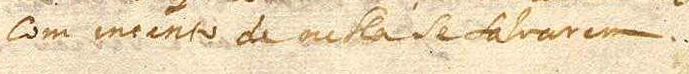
com intento de nella se salvarem.
